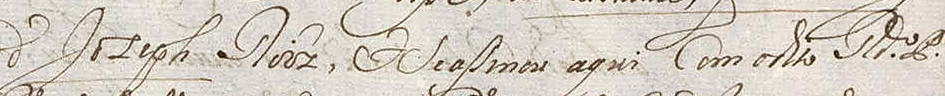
d̄ Jozeph Roiz̄ & Se assinou aqui Com o dito Rdo P.e
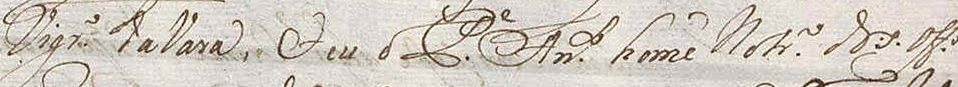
Vigr.o da Vara, & eu o P.e An.to homē Notr.o do s. Off.o
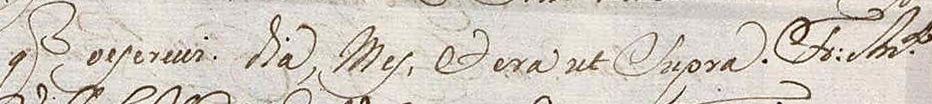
q̄ o escreui dia, Mes, & era ut Supra. Fr: An.to
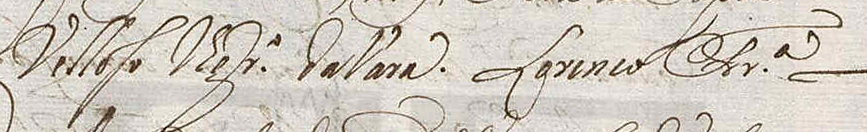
Velloso Vigr.o da Vara. Lorenco Frr.a
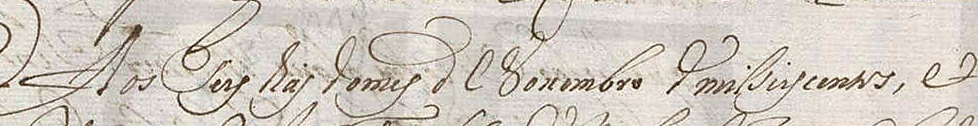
Aos seis dias do mes d̄ Nouembro d̄ mil seiscentos, &
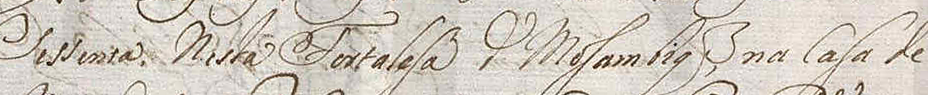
sessenta. Nesta Fortalesa d̄ Mosambiq̄, na Casa de
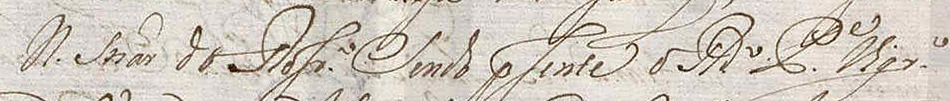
N. Snār do Rosr.o Sendo p̄sente o Rd.o P.e Vigr.o
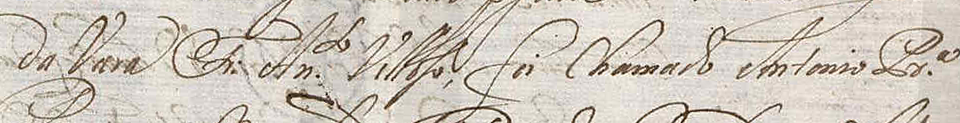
da Vara Fr: An.to Velloso, foi Chamado Antonio Pr.a
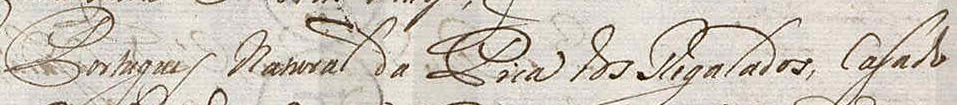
Portugues Natural da Pica dos Regalados, Casado
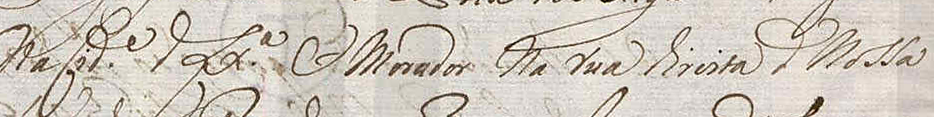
na Cid.e d̄ Lx.a & Morador na rua direita d̄ Nossa
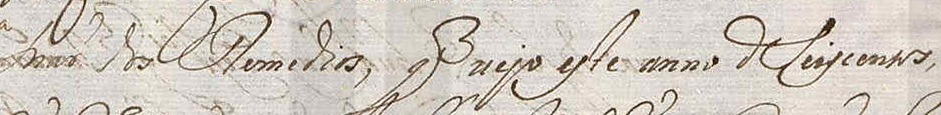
Snar̄ do Remedios, q̄ uejo este anno d̄ Seiscentos,
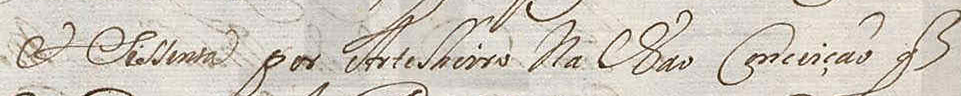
& Sessenta por Artelheiro Na Nao Conceiçaõ q̄
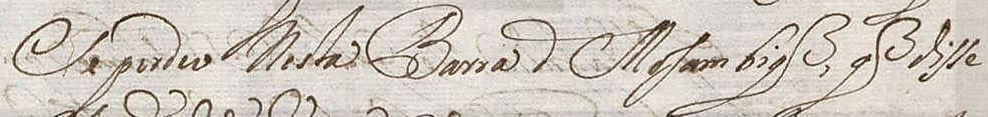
Se perdeo Nesta Barra d̄ Mosambiq̄, q̄ disse
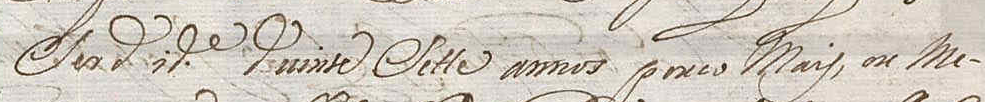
Ser d̄ id.e d̄ uinte Sette annos pouco Mais, ou Me
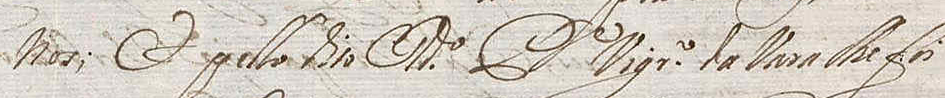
nos; & pello dito Rd.o P.e Vigr.o da Vara lhe foi
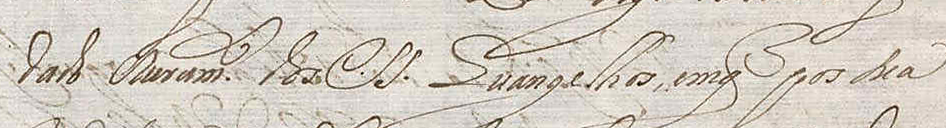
dado Iuram.to dos S.S. Euangelhos, em q̄ pos sua
